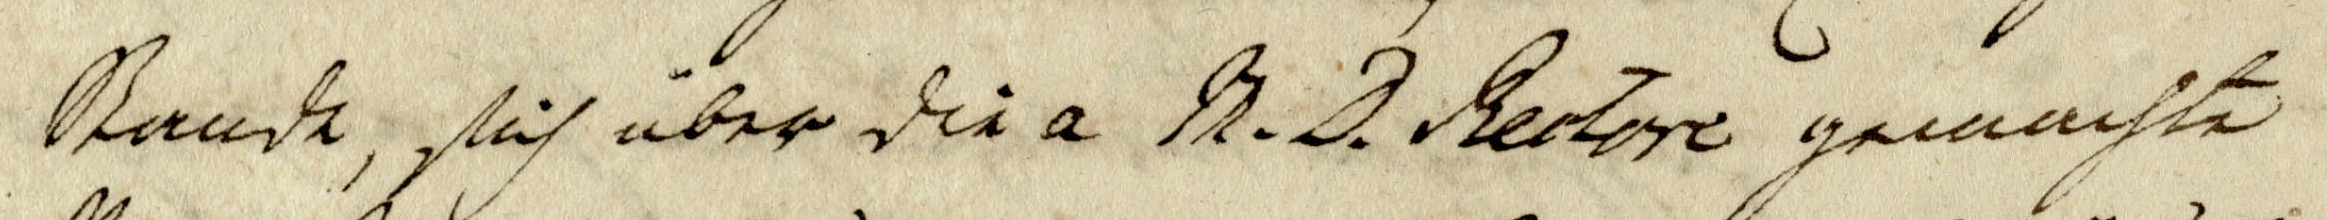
Stande, sich über die a M. D. Rectore gemachte
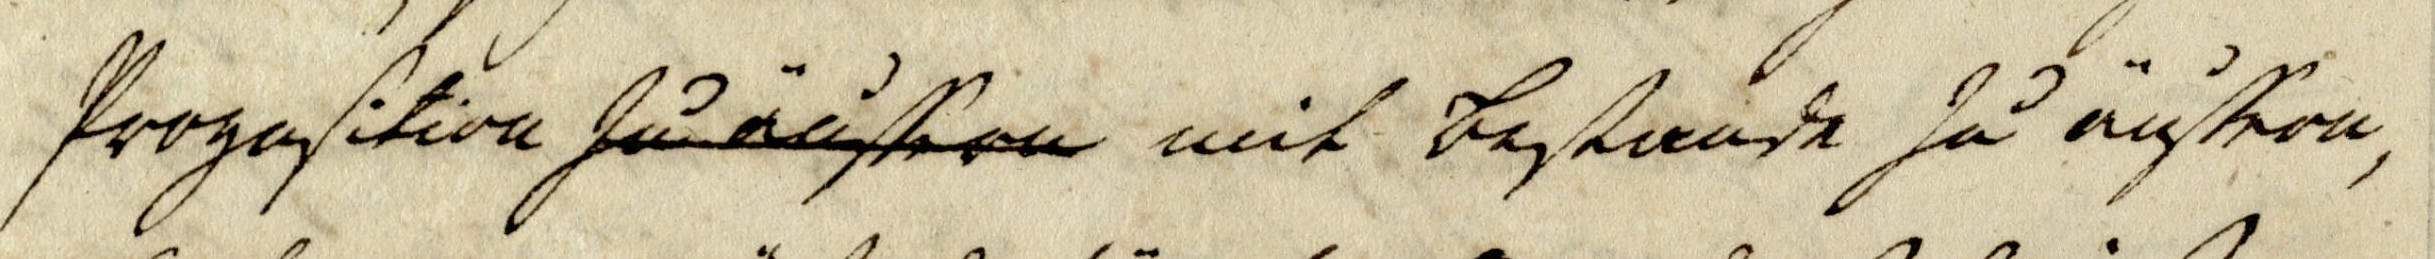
Proposition zuaussern mit Bestande zu äussern,
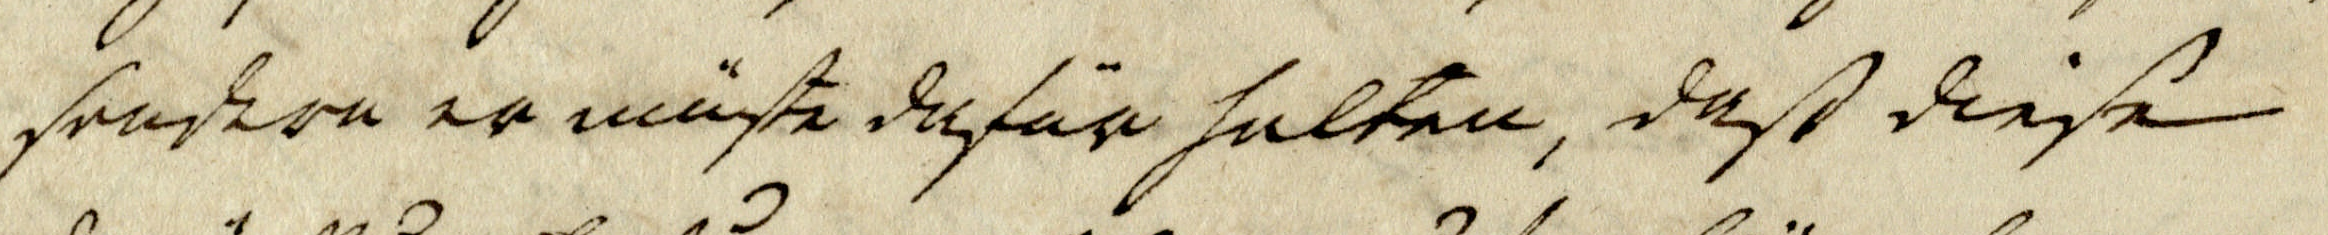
sondern er müßte dafür halten, daß diese
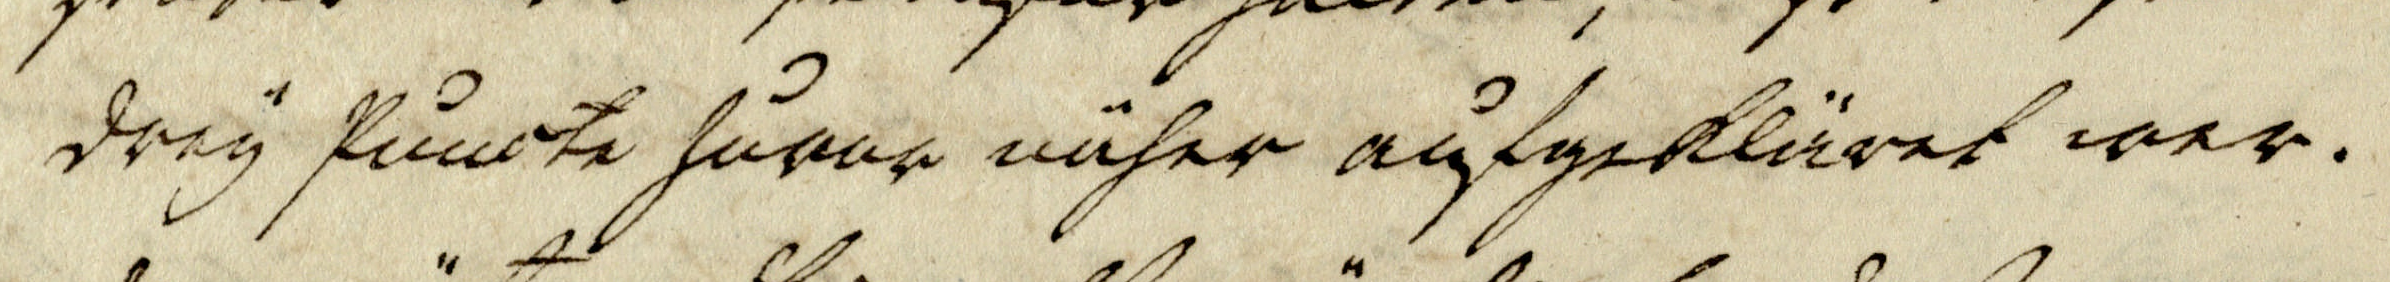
dreÿ Puncte zuvor näher aufgekläret wer¬
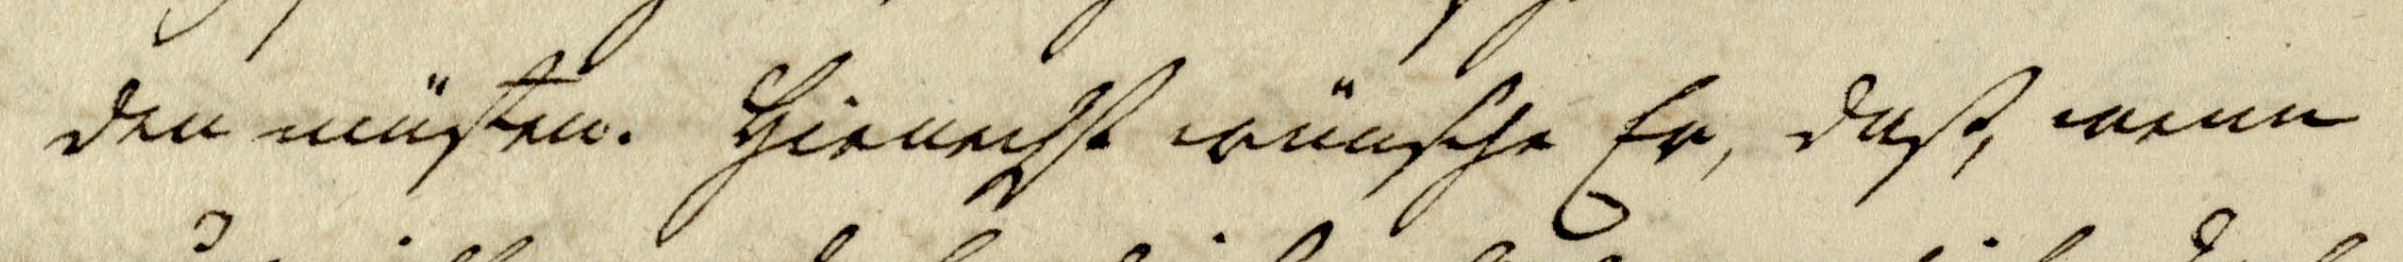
den müßten. Hienechst wünsche Er, daß wenn
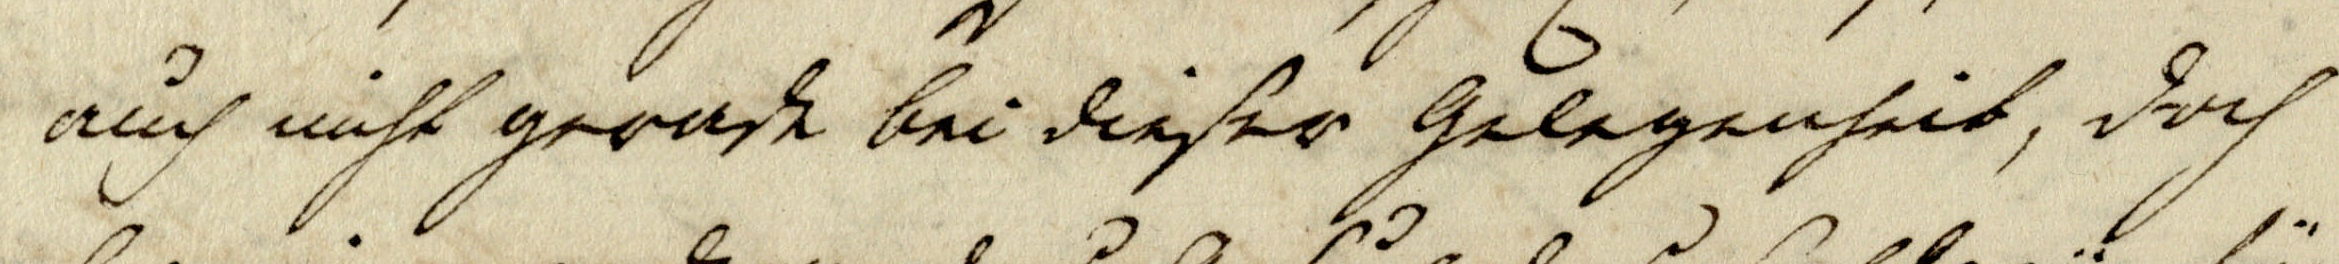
auch nicht gerade bei dieser Gelegenheit, doch
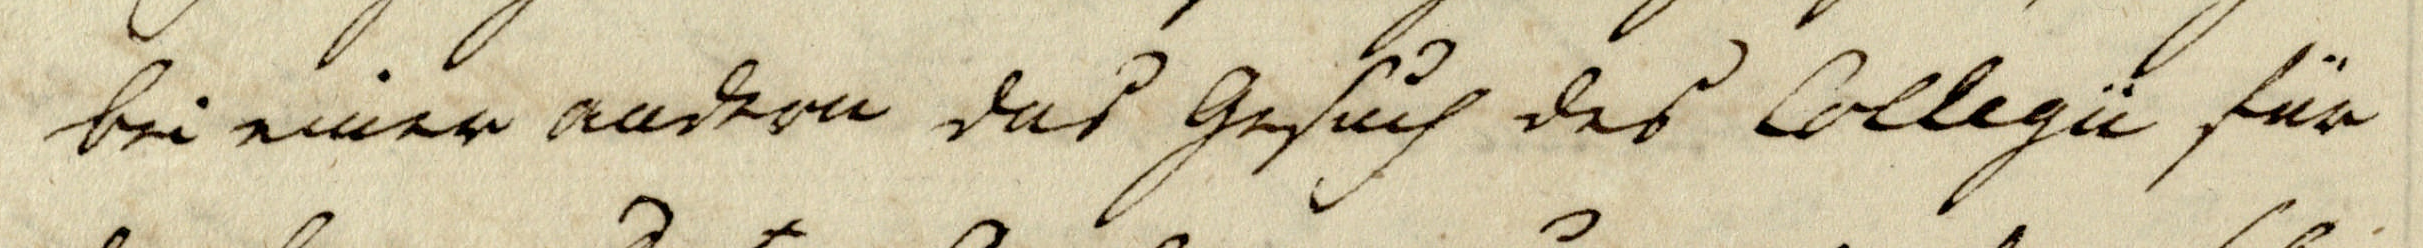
bei einer andern das Gesuch des Collegii für
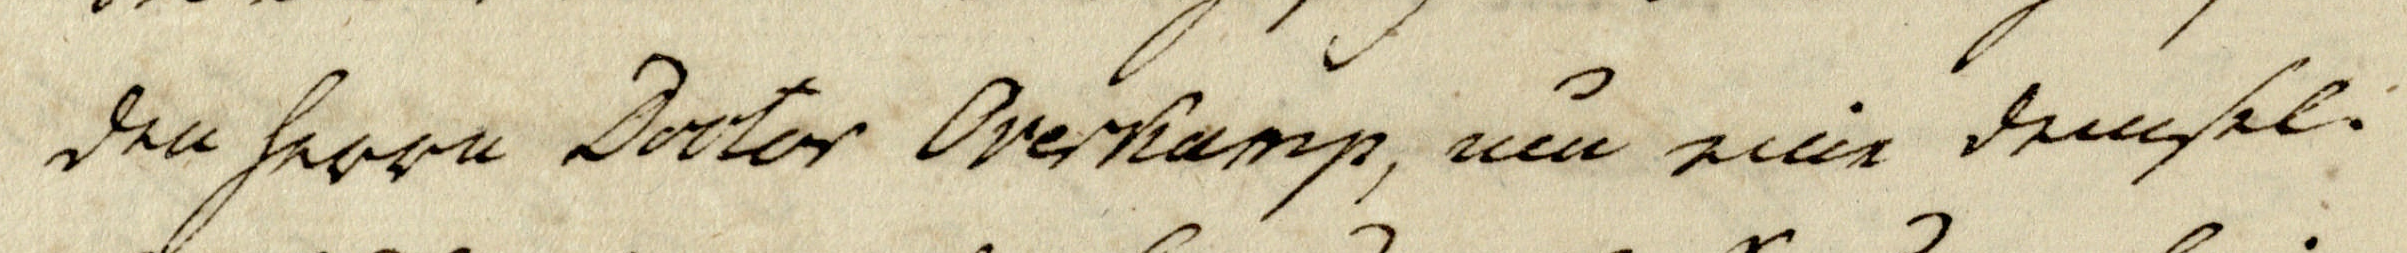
den Herrn Doctor Overkamp, um eine demsel-
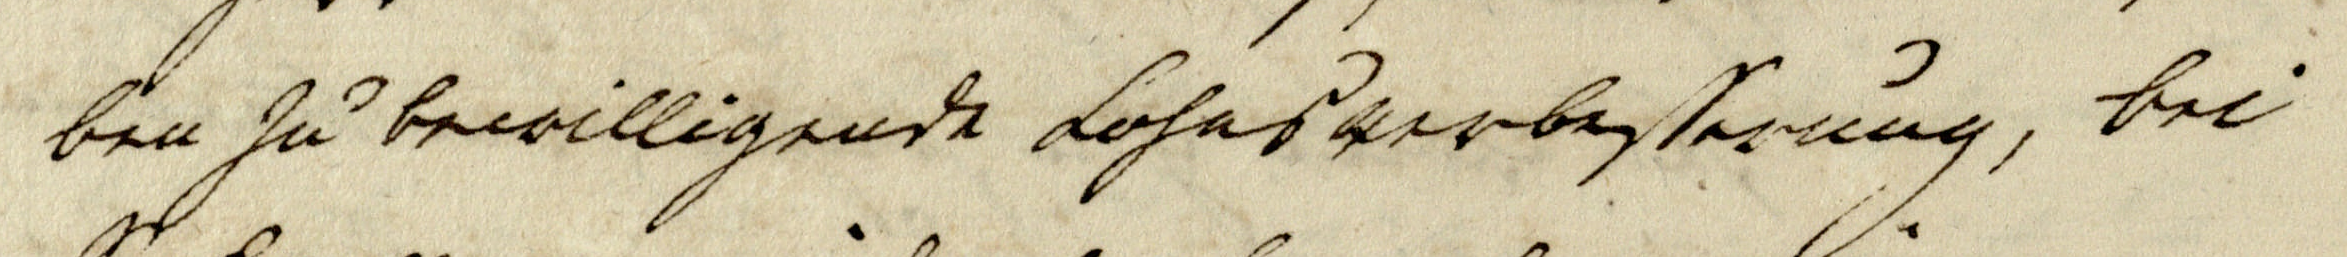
ben zu bewilligende Lohnsverbesserung, bei
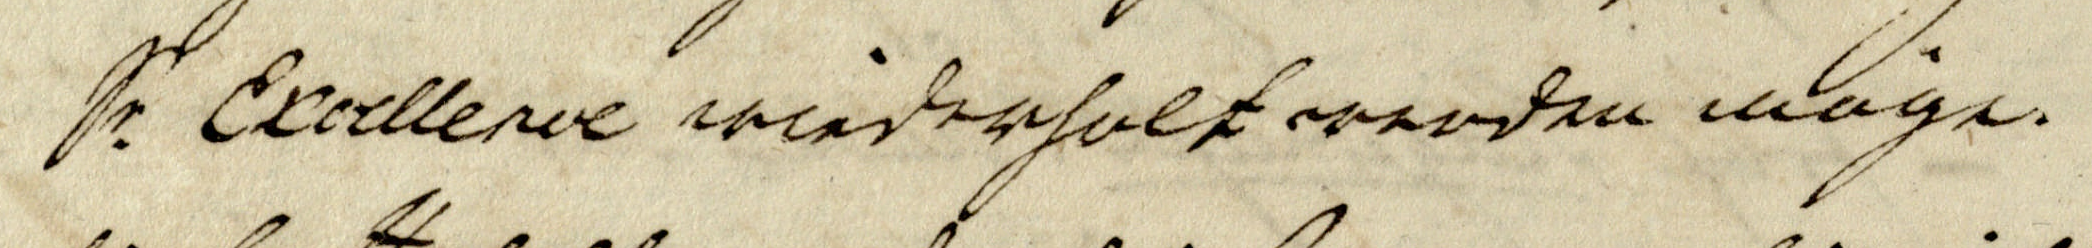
Sr Excellence wiederholt werden möge.
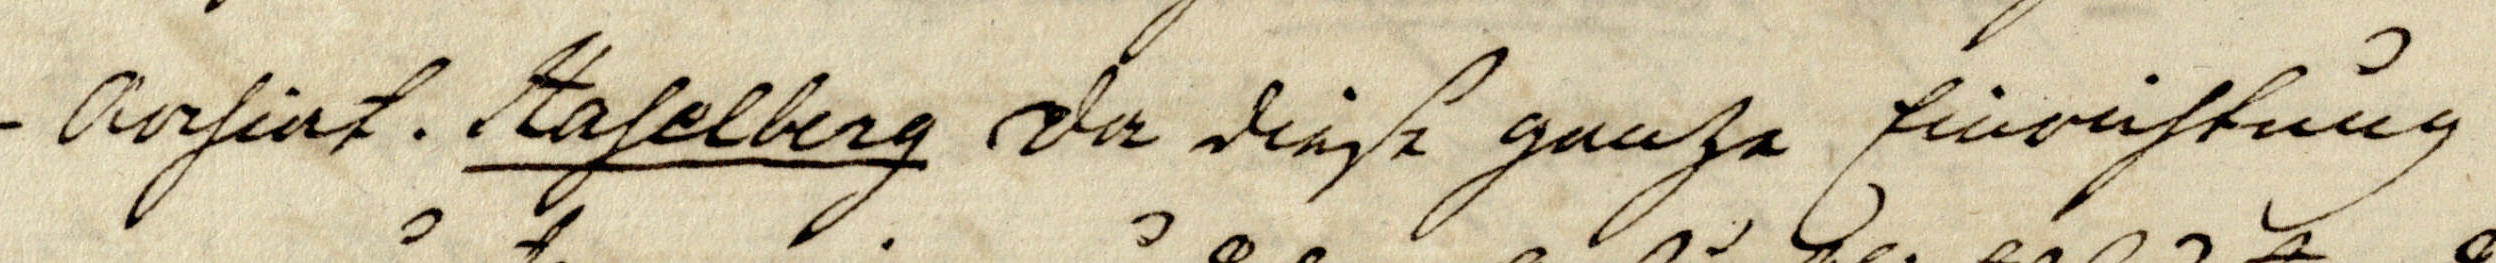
Archiat. Haselberg da diese ganze Einrichtung
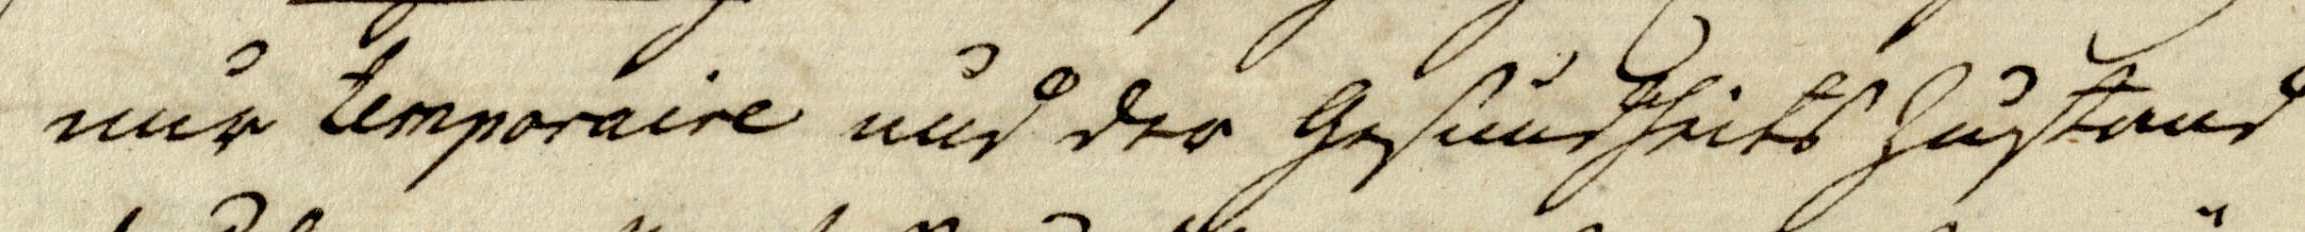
nur temporaire und der Gesundheitszustand
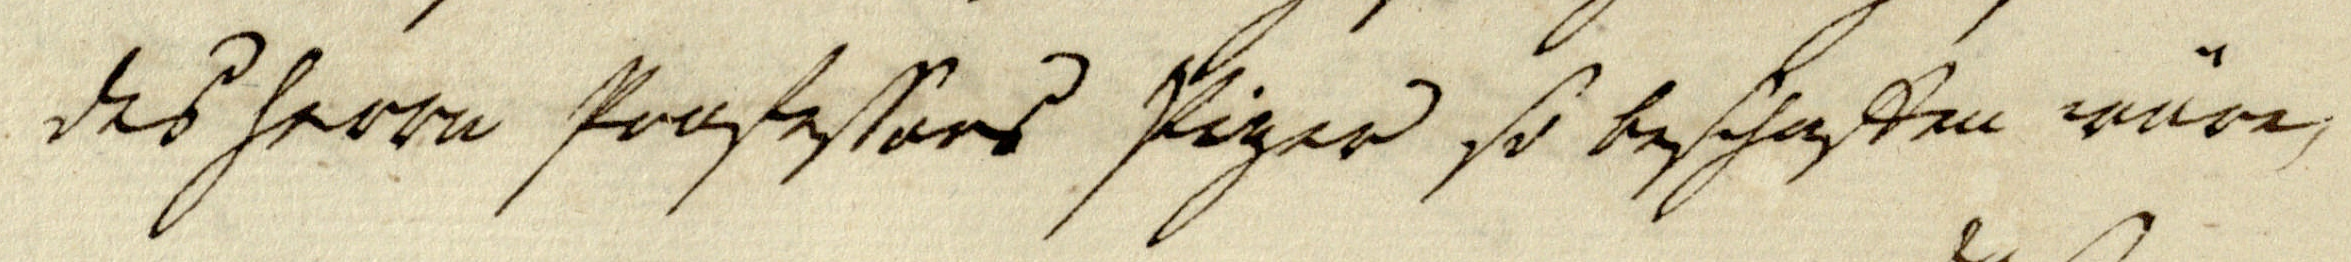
des Herrn Professors Piper so beschaffen wäre,
